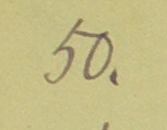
50
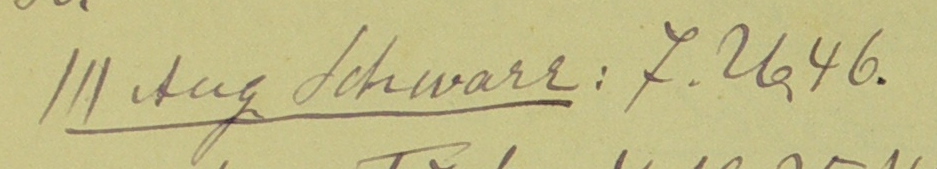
11.) Aug. Schwarz 7.26.46.
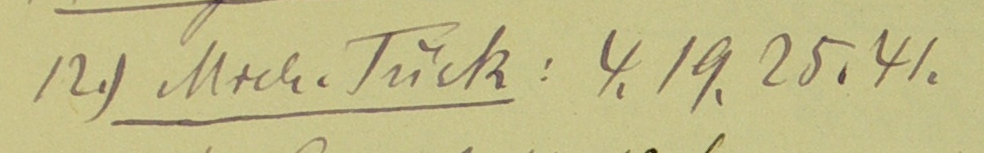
12.) Mich. Türk 4.19.25.41.
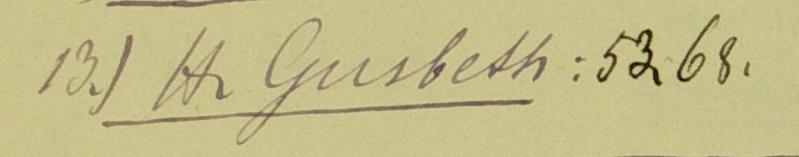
13.) Heinr. Gusbeth 53.68.
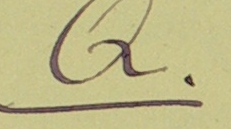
Q
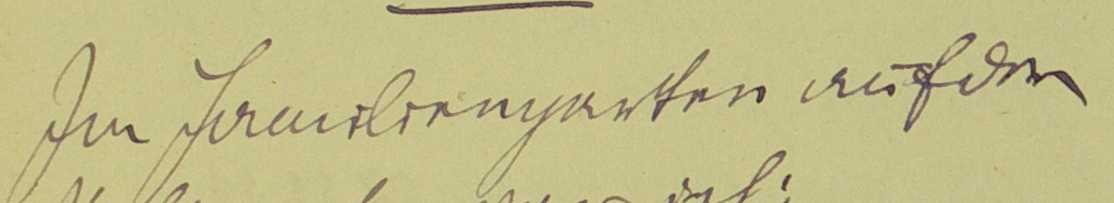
Im Familiengarten auf der
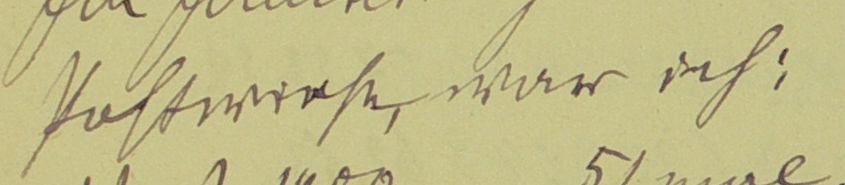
Postwiese war ich :
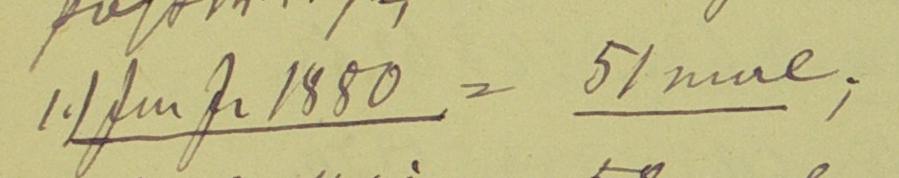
1.) Im Jahre 1880 = 51 mal.-
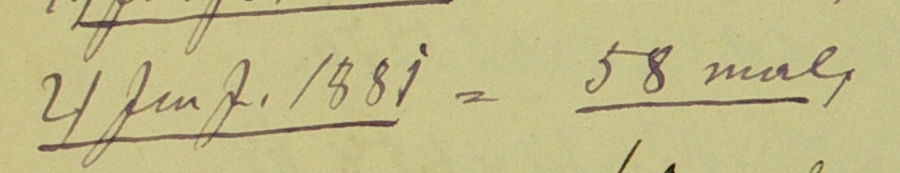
2.) * 1881 = 58 mal.-
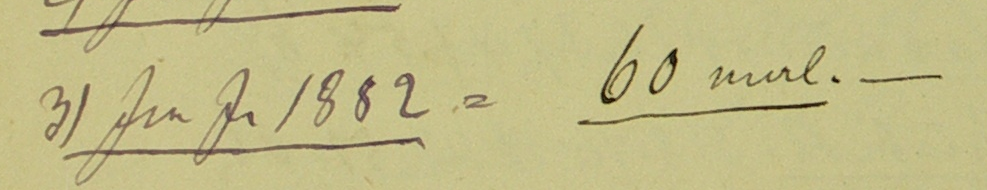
3.) * 1882 = 60 mal.-
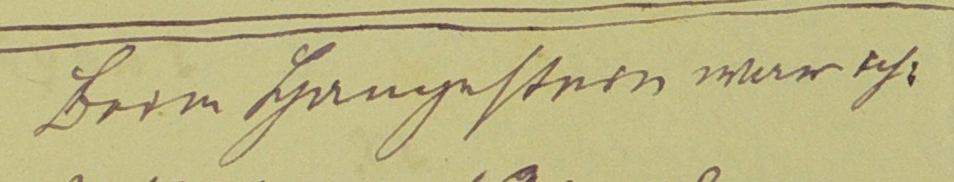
Beim Hangestein war ich:
